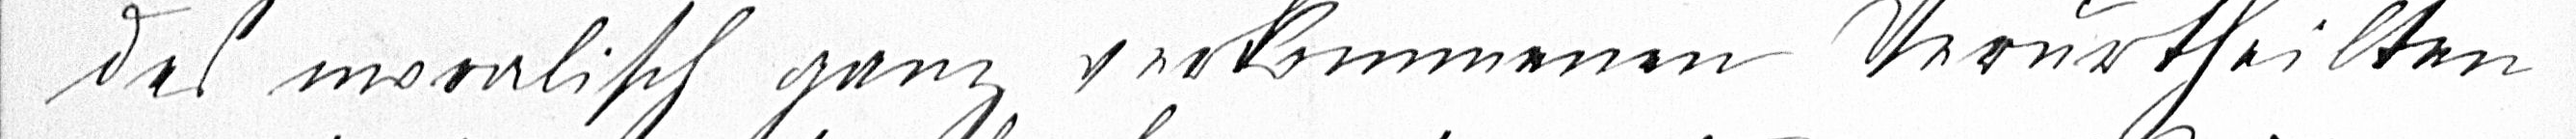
des moralisch ganz verkommenen Verurtheilten
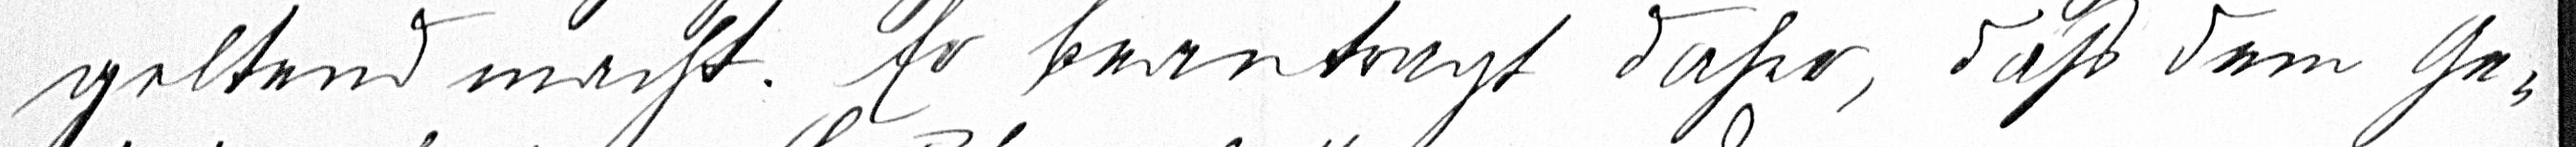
geltend macht. Er beantragt daher, daß dem Ge¬
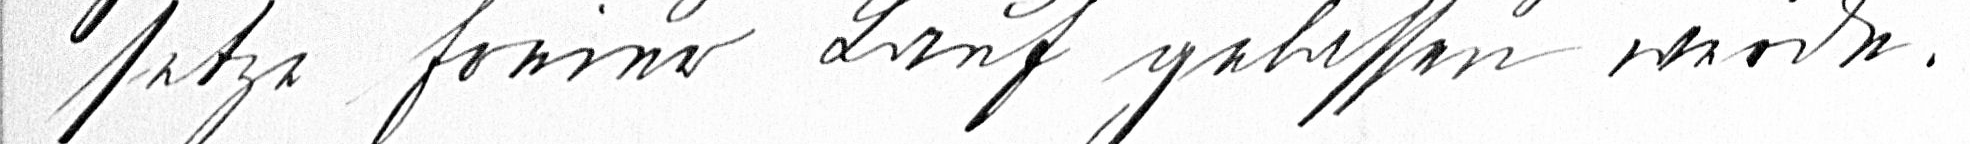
setze freier Lauf gelassen werde.
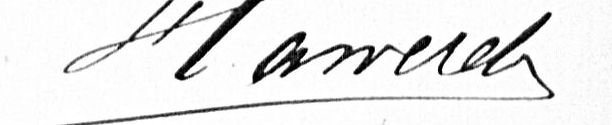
Hawerd
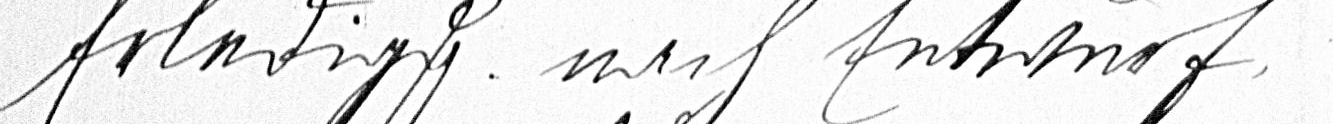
Erledigg. nach Entwurf.
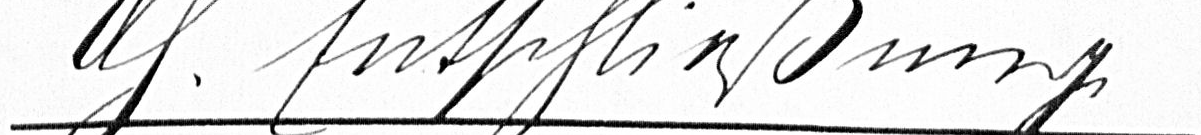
Ah. Entschließung
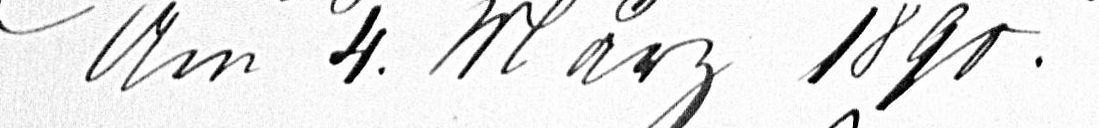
Am 4. März 1890.
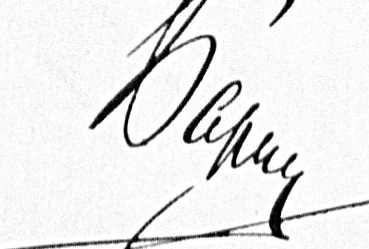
xx
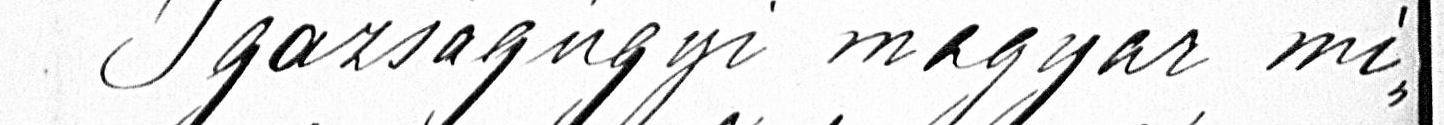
Jgazságügyi magyar mi¬
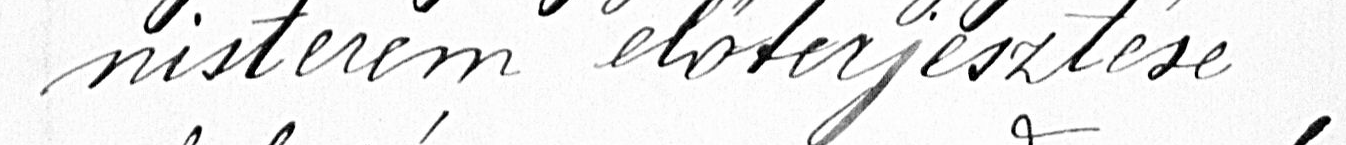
nisterem elöterjesztése
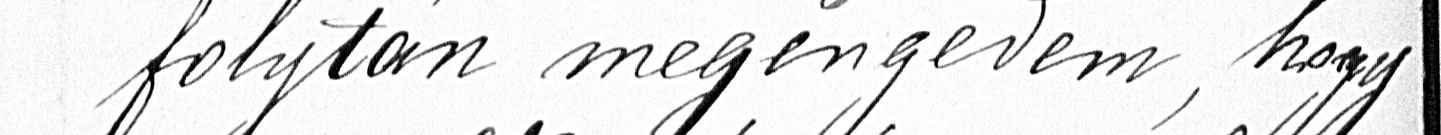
folytán megengedem, hogy
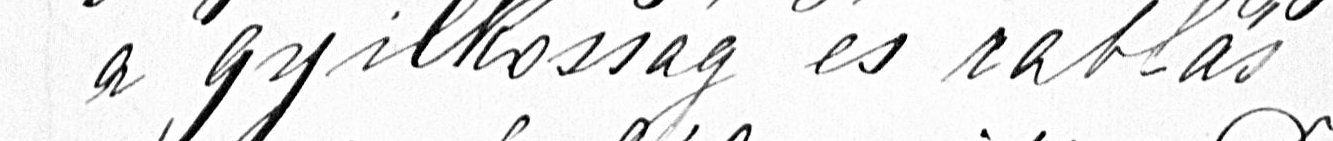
a gyilkosság és rablás
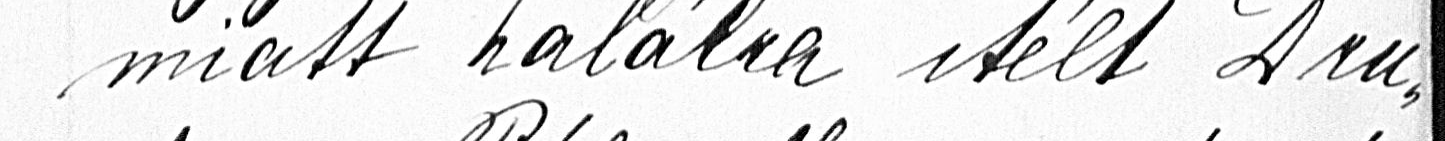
miatt halálra itélt Dru¬
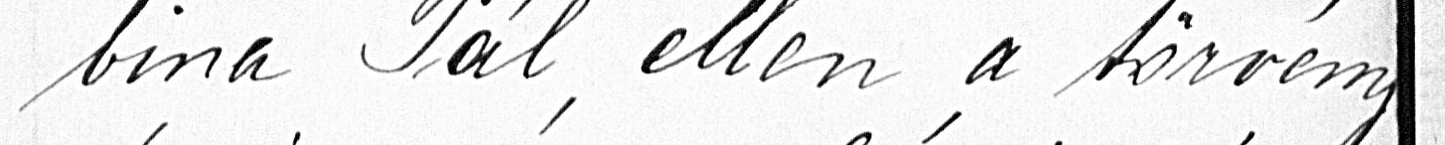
bina Pál, ellen a törvémxx
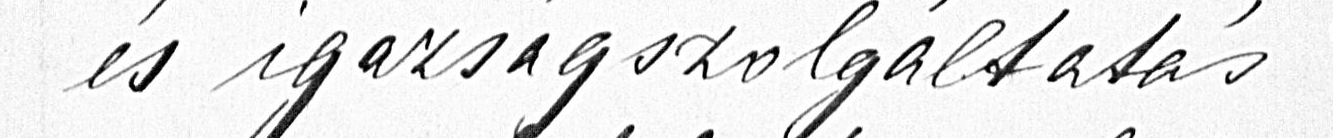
és igazságszolgáltatás
